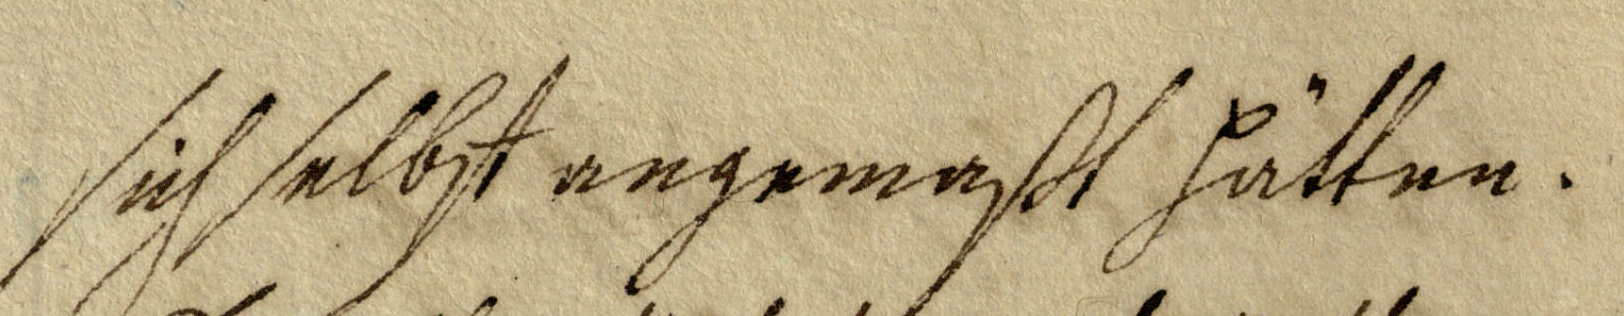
sich selbst angemaßt hätten.
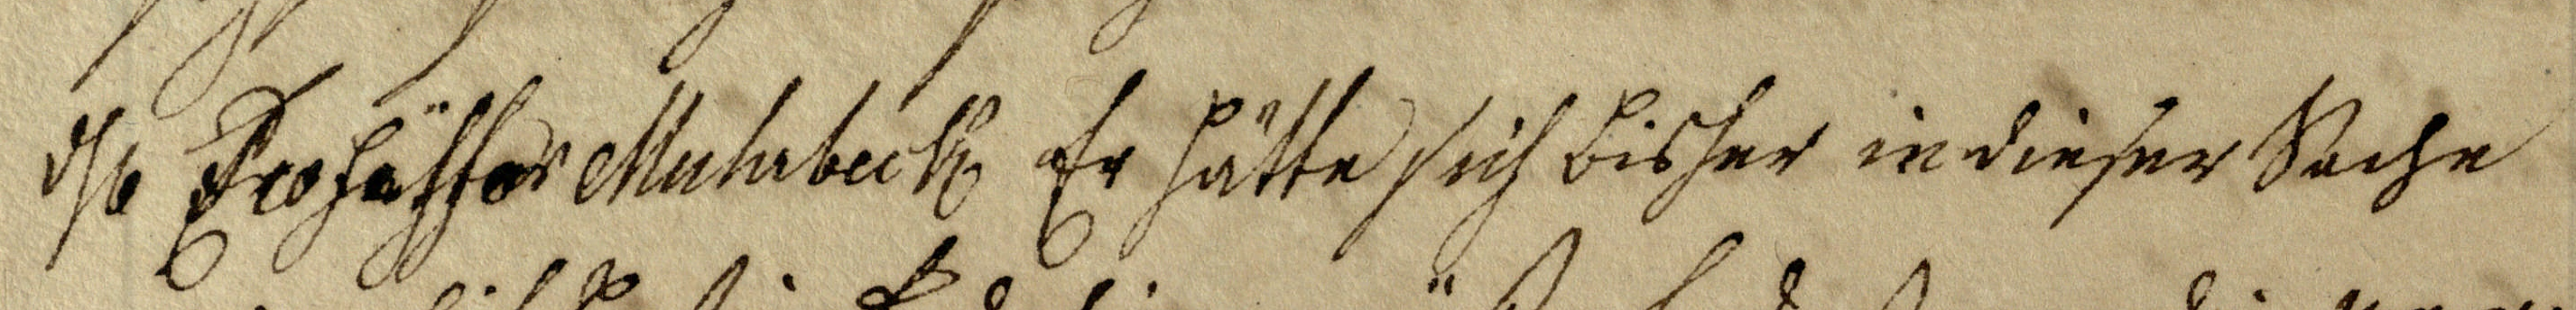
dh Professor Muhrbeck. Er hätte sich bisher in dieser Sache
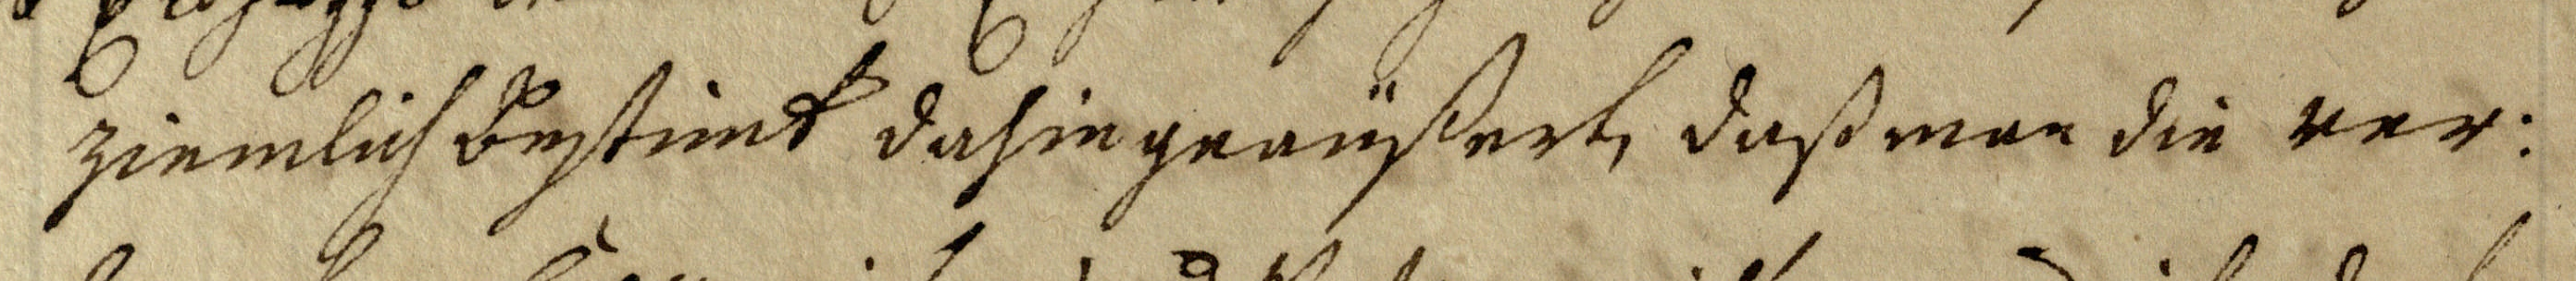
ziemlich bestimt dahin geäußert, daß man die ver¬
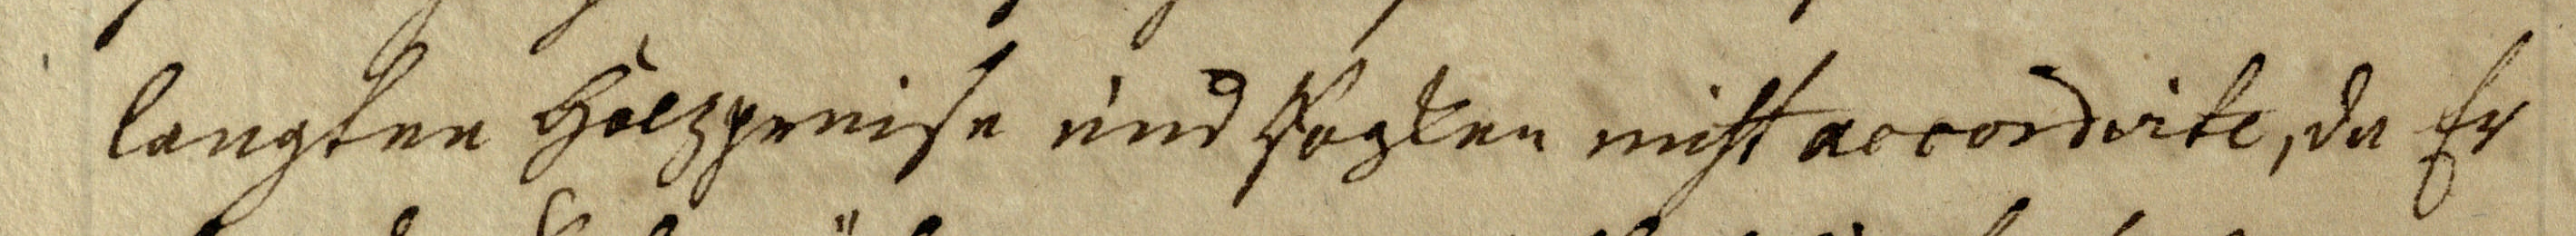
langte Holzpreise und Rogken nicht accordirte, da Er
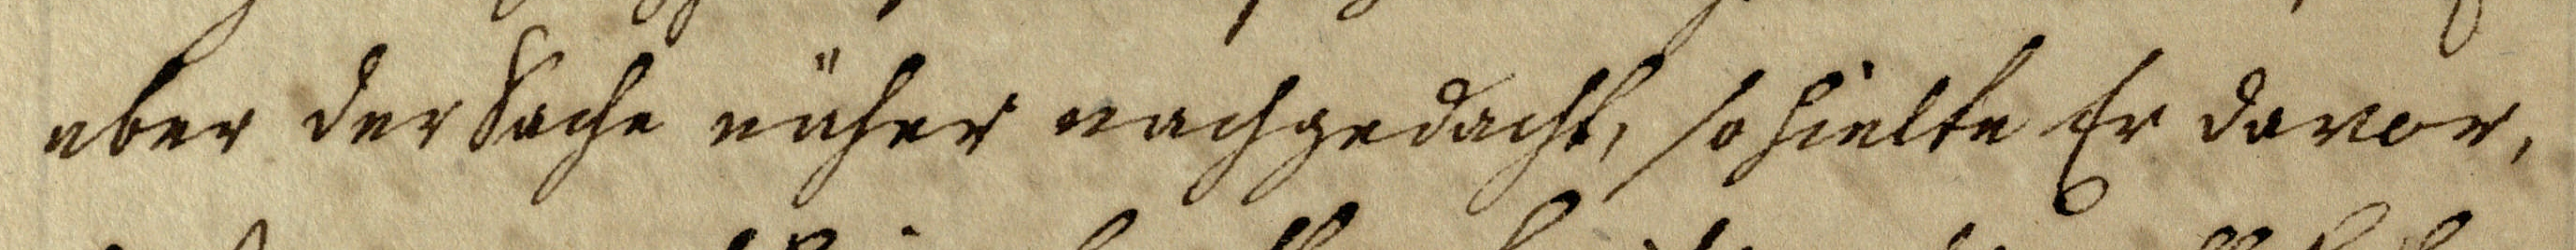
aber der Sache näher nachgedacht, so hielte Er davor,
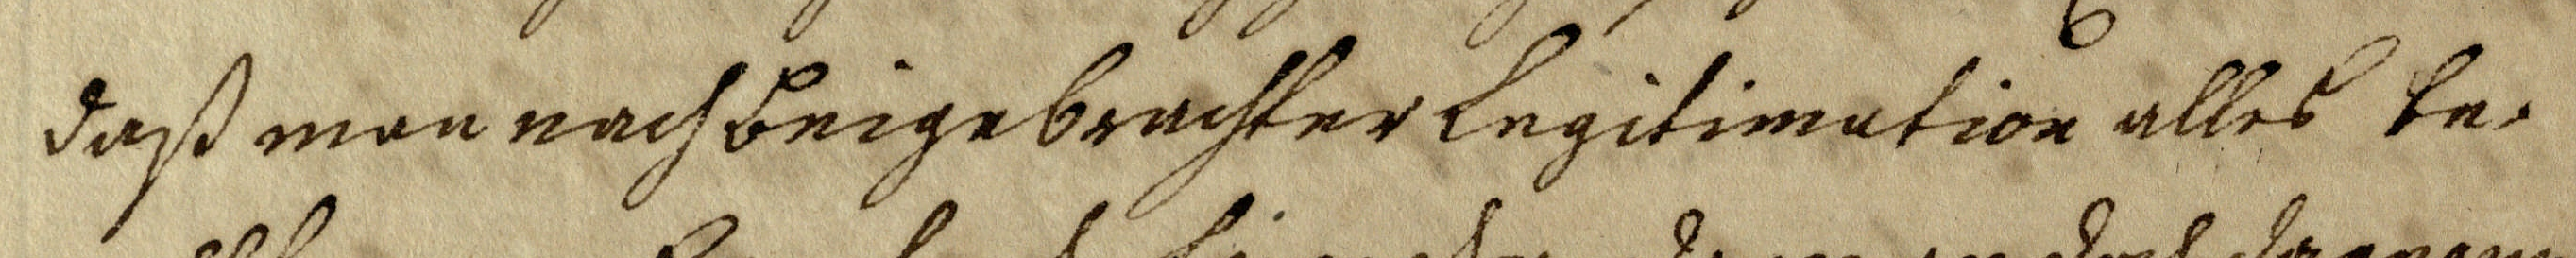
daß man nach beigebrachter Legitimation alles be¬
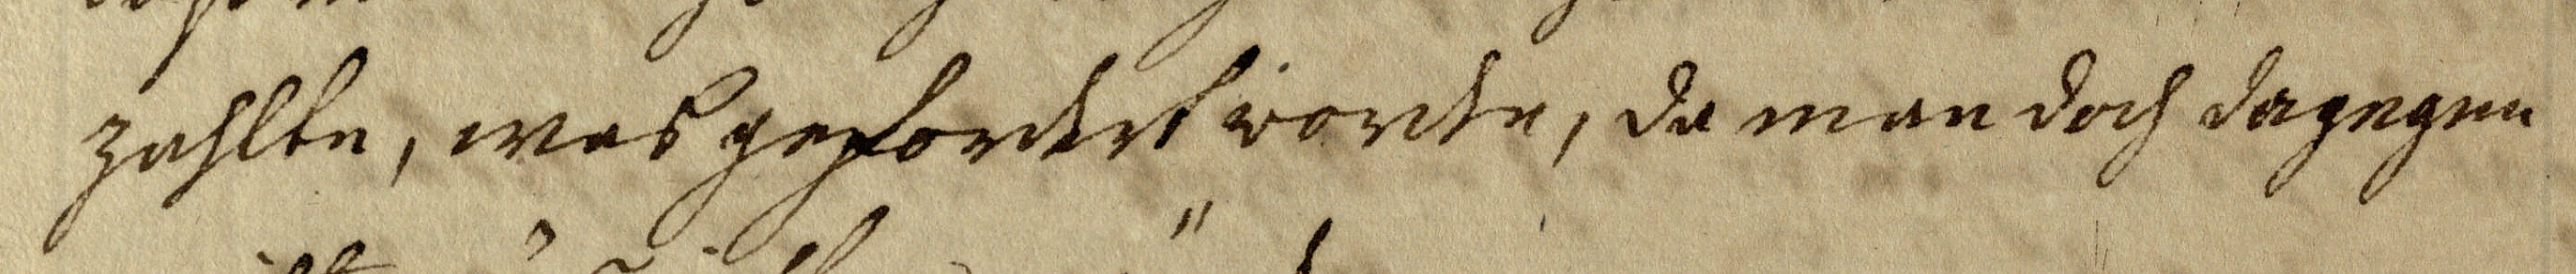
zahlte, was gefordert worden, da man doch dagegen
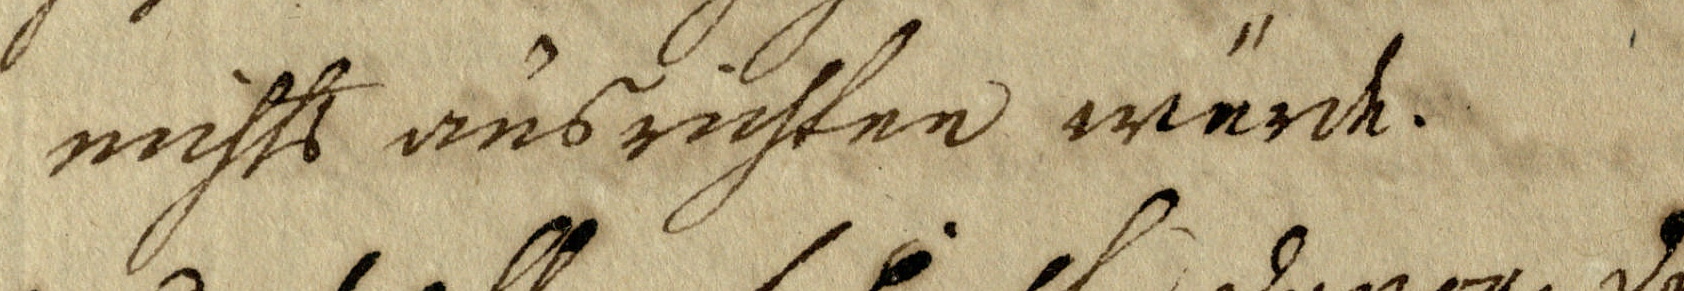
nichts ausrichten würde.
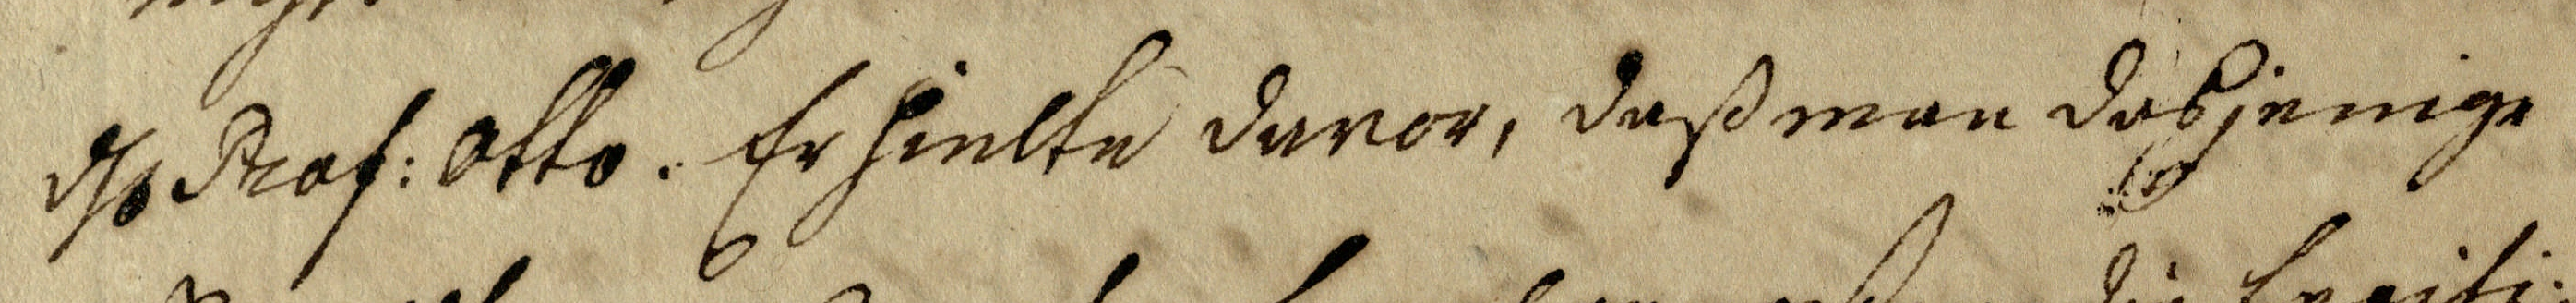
dh. Prof. Otto. Er hielte davor, daß man dasjenige
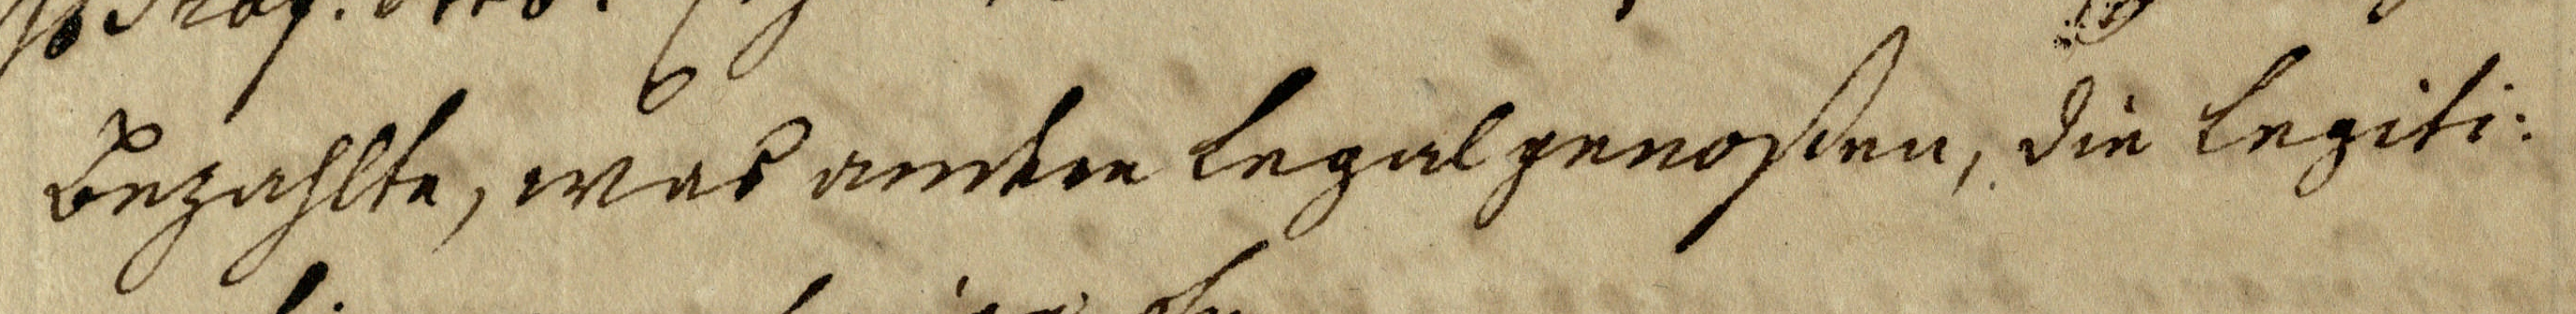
bezahlte, was andern legal genoßen, die Legiti¬
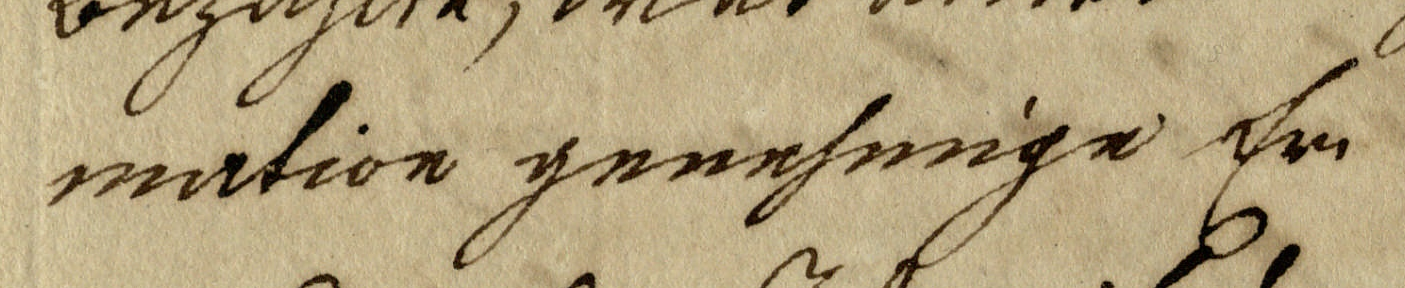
mation genehmige Er.
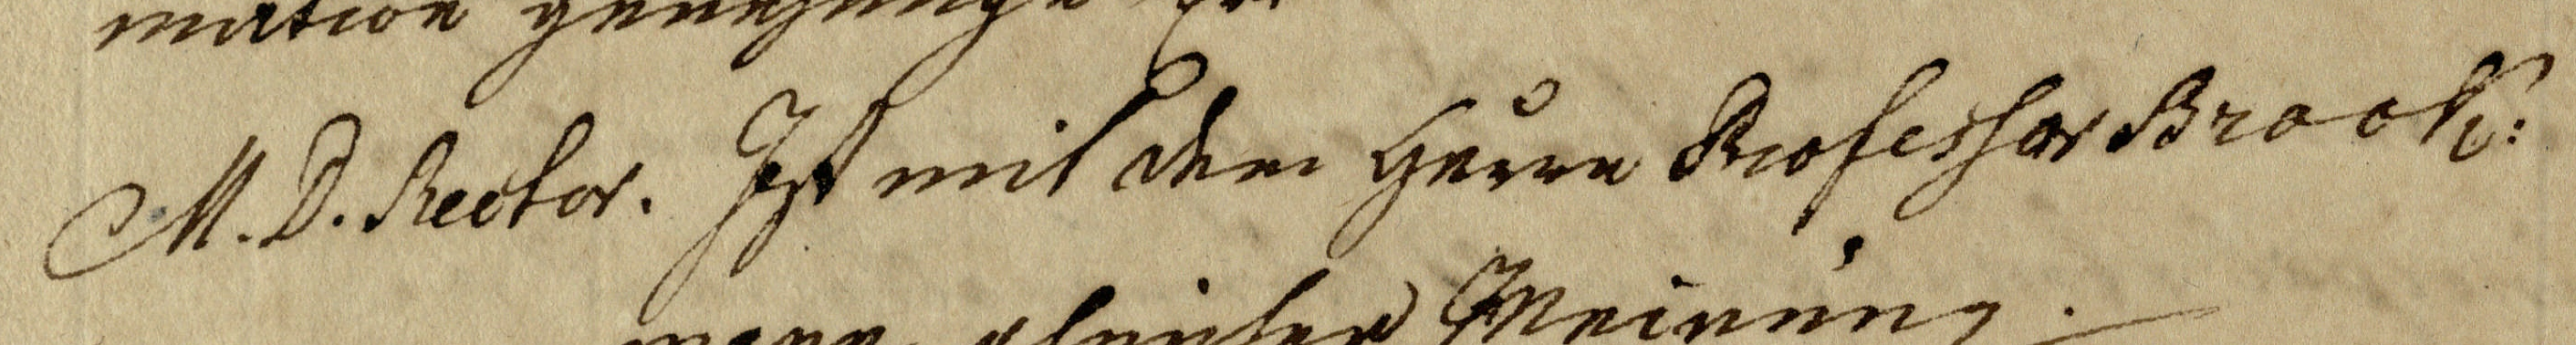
M. D. Rector. Ist mit dem Herrn Professor Brock¬
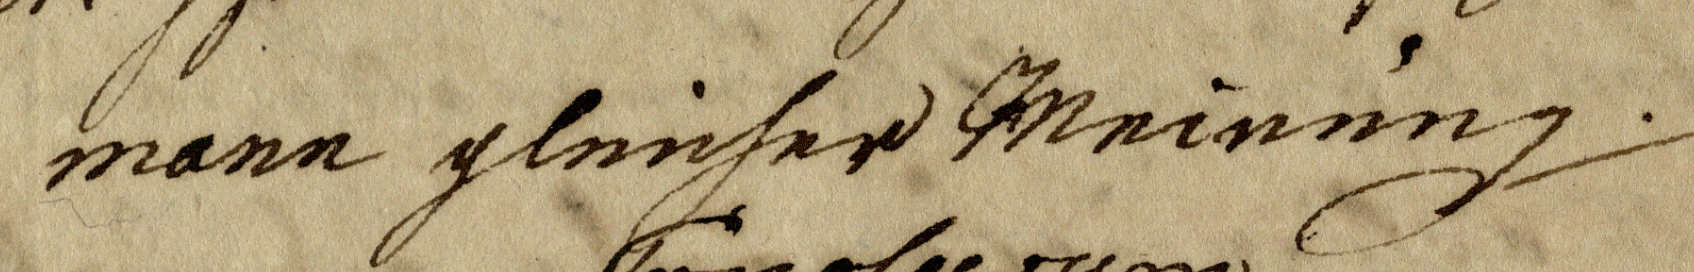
mann gleicher Meinung.
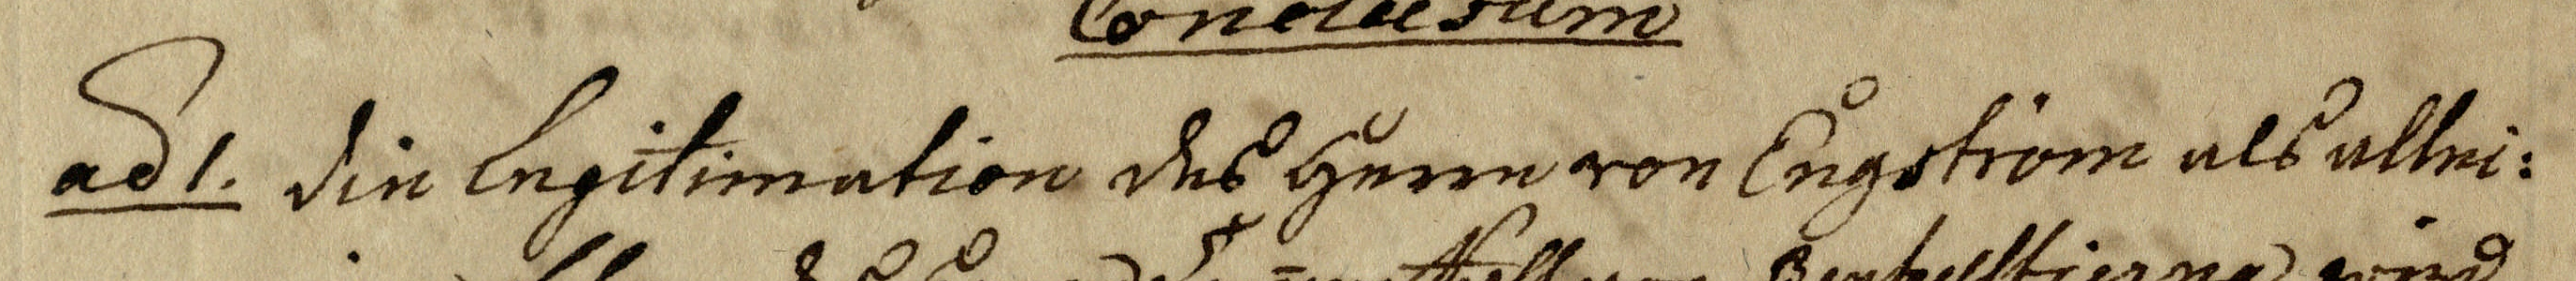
ad 1. die Legitimation des Herrn von Engström als allei¬
